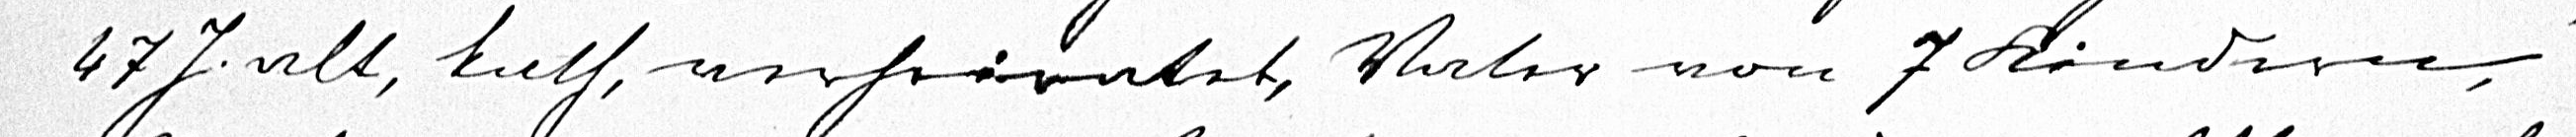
47 J. alt, kath, verheiratet, Vater von 7 Kindern,
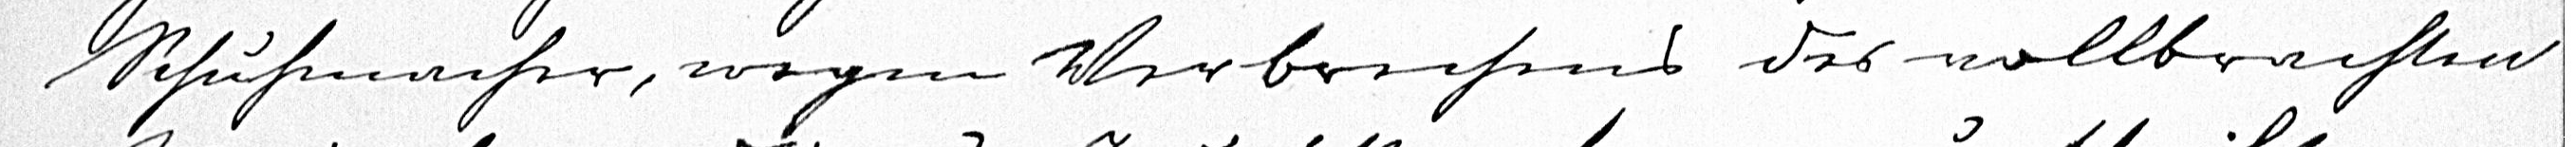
Schuhmacher, wegen Verbrechens des vollbrachten
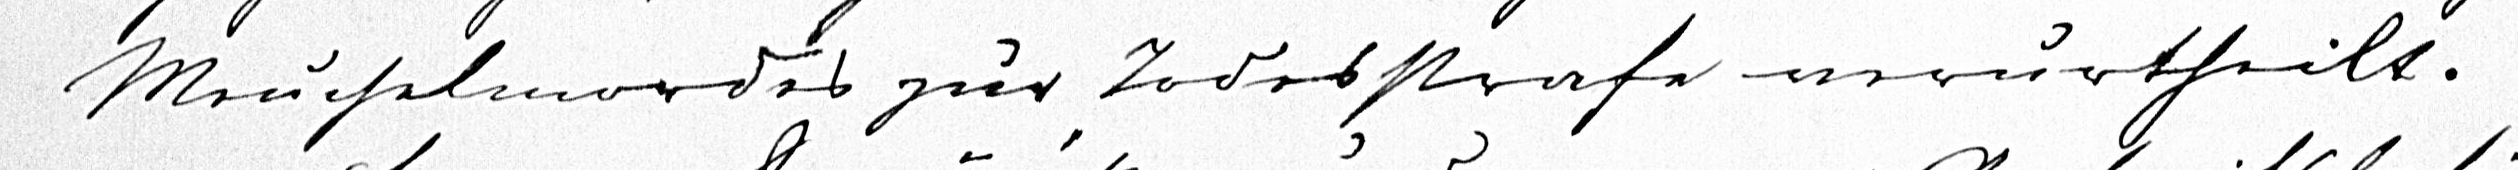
Meuchelmordes zur Todesstrafe verurtheilt.
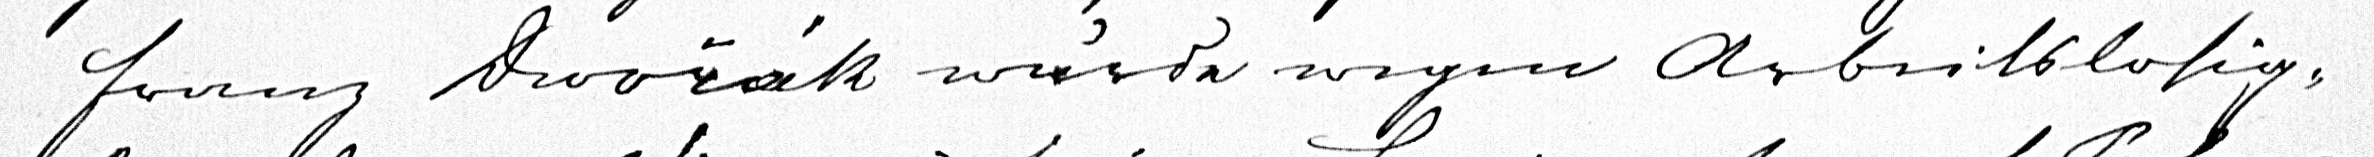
Franz Dwořák wurde wegen Arbeitslosig¬
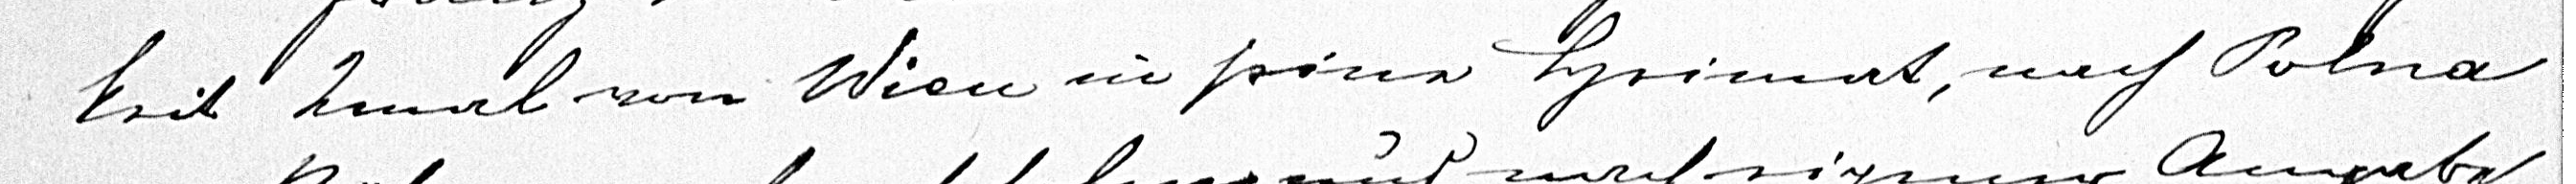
keit 2mal von Wien in seine Heimat, nach Polna
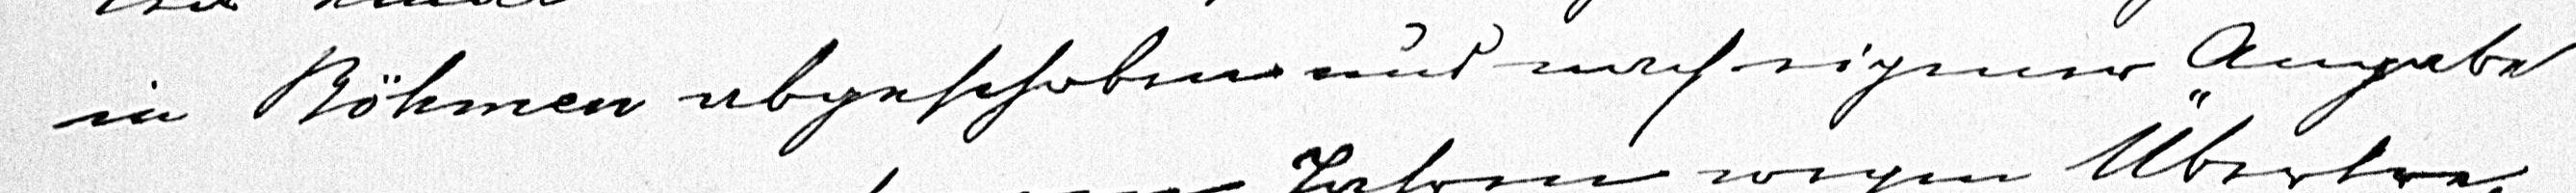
in Böhmen abgeschoben und nach eigener Angabe
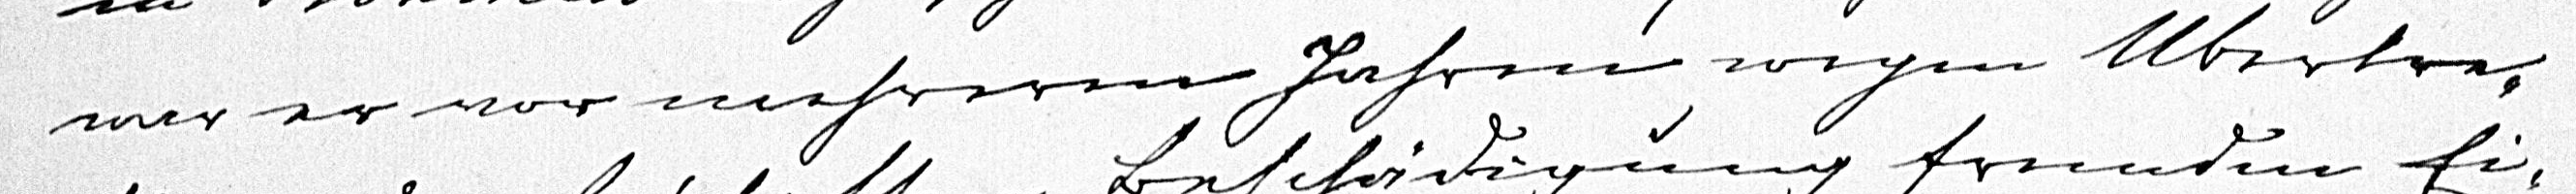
war er vor mehreren Jahren wegen Übertre¬
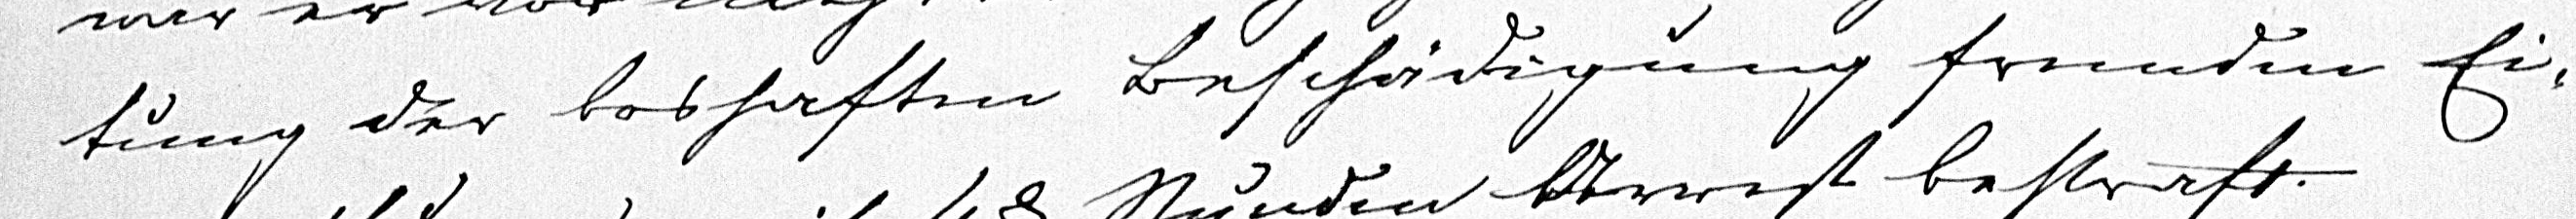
tung der loshaften Beschädigung fremden Ei¬
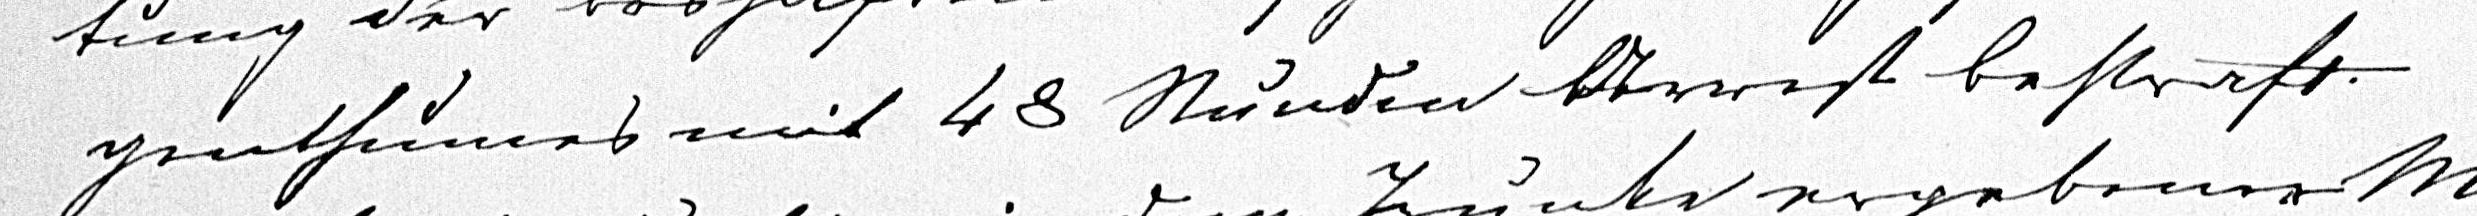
genthumes mit 48 Stunden Arrest bestraft.
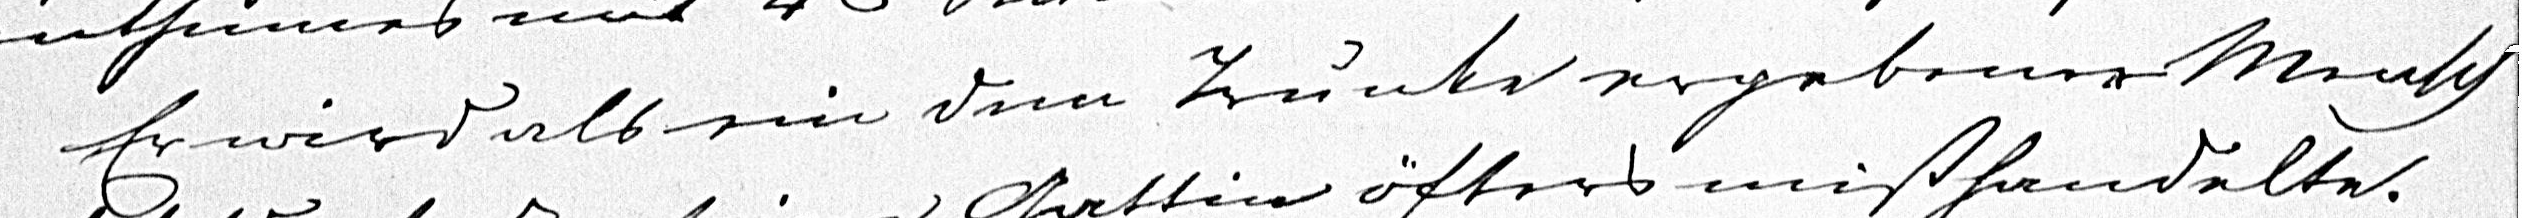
Er wird als ein dem Trunke ergebener Mensch
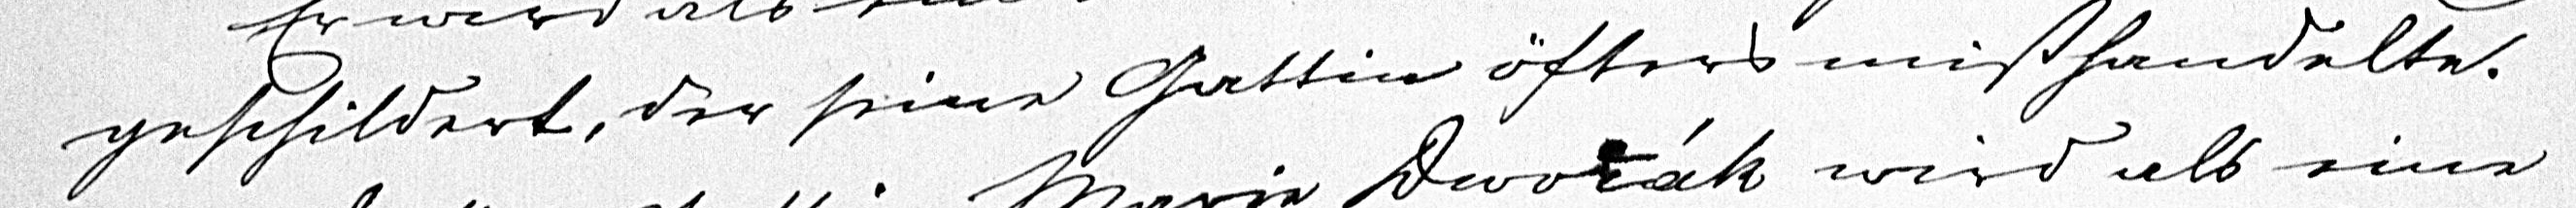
geschildert, der seine Gattin öfters mißhandelte.
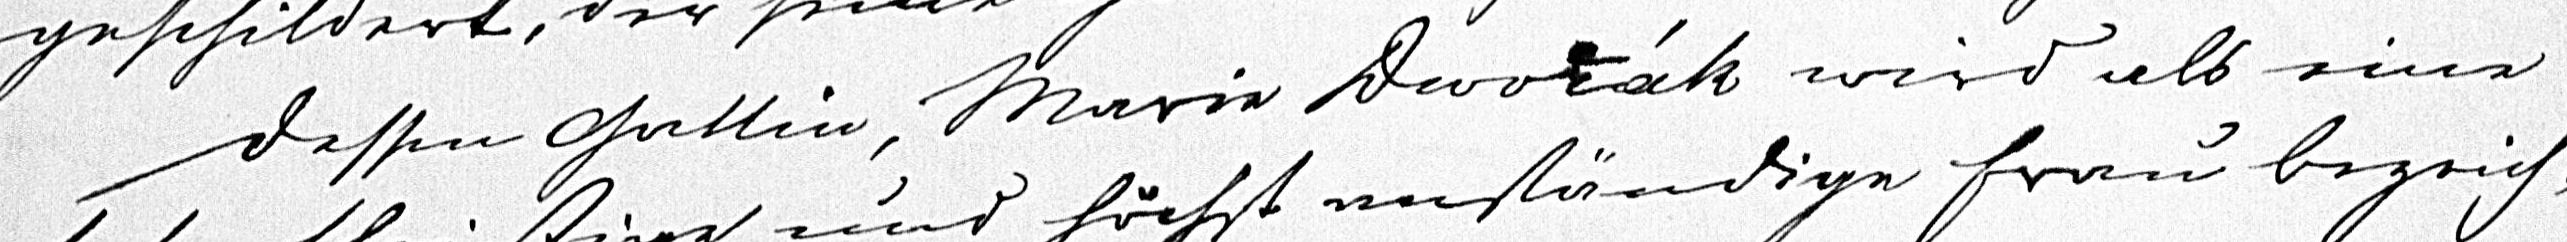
Dessen Gattin, Marie Dwořák wird als eine
